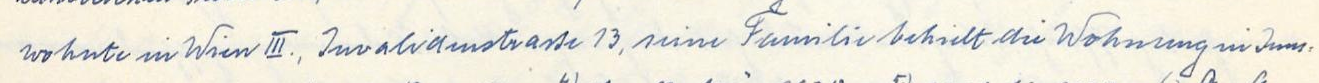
wohnte in Wien III, Invalidenstraße 13, seine Familie behielt die Wohnung in Inns-
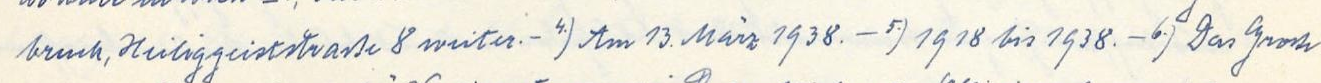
bruck, Heiliggeiststraße 8 weiter.- 4) Am 13. März 1938.- 5) 1918-1938.- 6) Das Große
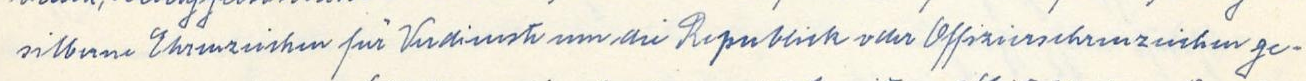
silberne Ehrenzeichen für Verdienste um die Republik oder Offiziersehrenzeichen ge-
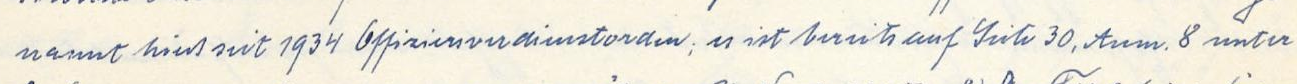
nannt hieß seit 1934 Offiziersverdienstorden; es ist bereits auf Seite 30, Anm 8 unter
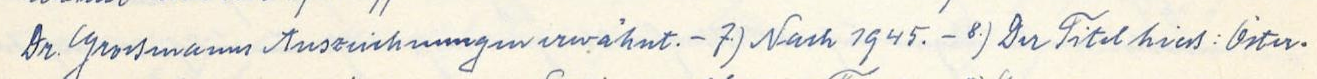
Dr. Großmanns Auszeichnungen erwähnt. – 7) Nach 1945. – 8) Der Titel hieß: Öster-
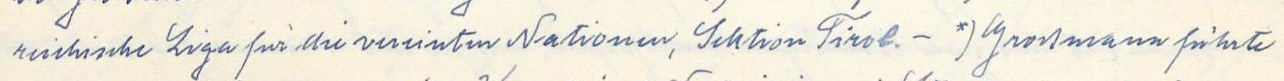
reichische Liga für die vereinten Nationen, Sektion Tirol.- * Großmann führte
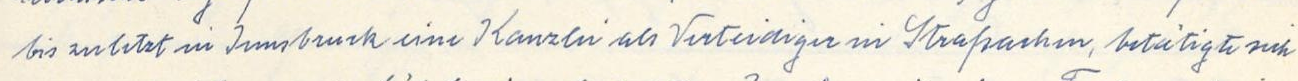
bis zuletzt in Innsbruck eine Kanzlei als Verteidiger in Strafsachen, beteiligte sich
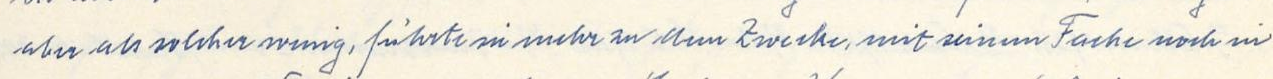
aber als solcher wenig, führte sie mehr zu dem Zwecke, mit seinem Fache noch in
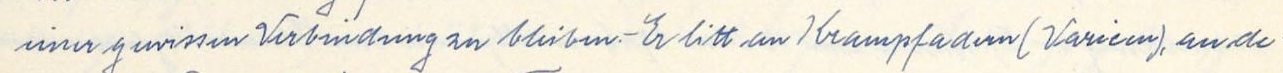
einer gewissen Verbindung zu bleiben.- Er litt an Krampfadern (Varicen), an de-
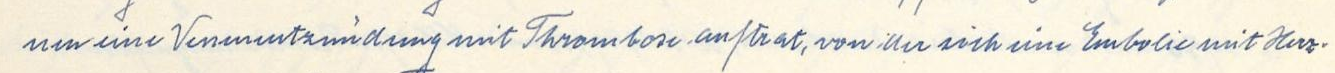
nen eine Venenentzündung mit Thrombose auftrat, von der sich eine Embolie mit Herz-
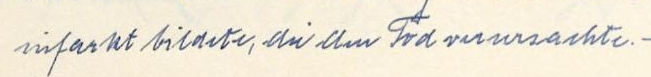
infarkt bildete, die den Tod verursachte.-
